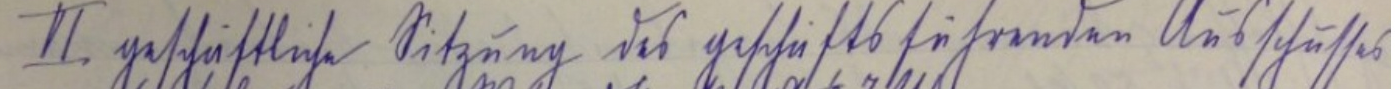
VI . geschäftliche Sitzung des geschäftsführenden Ausschusses
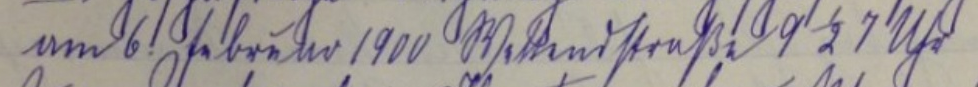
am 6. Februar 1900 Westendstraße 9 ½7 Uhr
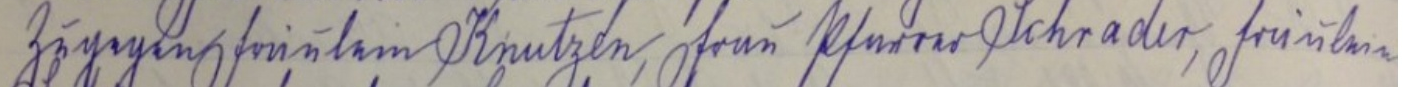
Zugegen: Fäulein Knutzen, Frau Pfarrer Schrader,Fräulein
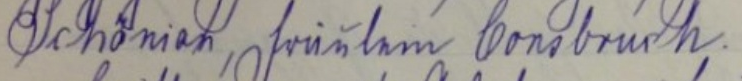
Schönian, Fräulein Consbruck
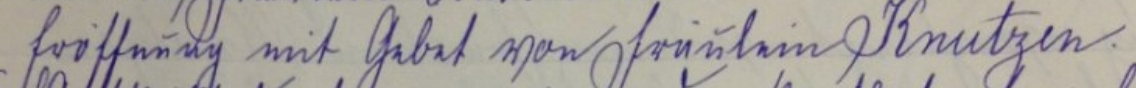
Eröffnung mit Gebet von Fräulein Knutzen
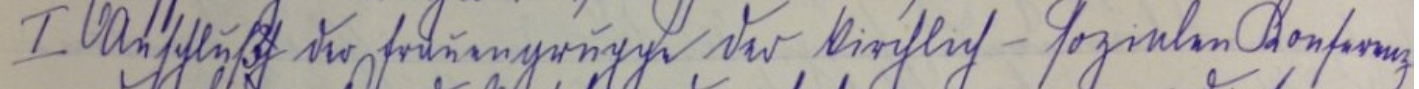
I Anschluß der Frauengruppe der kirchlich-sozialen Konferenz
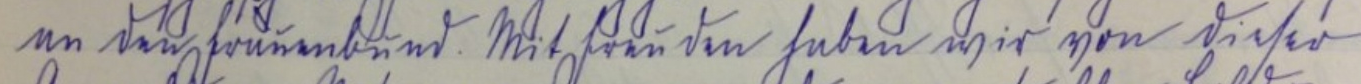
an den Frauenbund. Mit Freuden haben wir von dieser
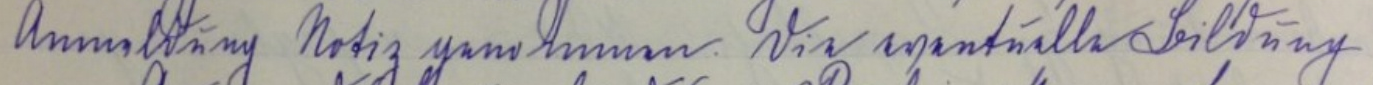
Anmeldung Notiz genommen. Die eventuelle Bildung
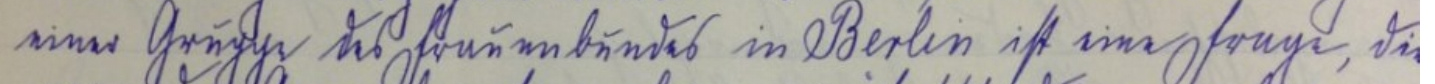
einer Gruppe des Frauenbundes in Berlin ist eine Frage, die
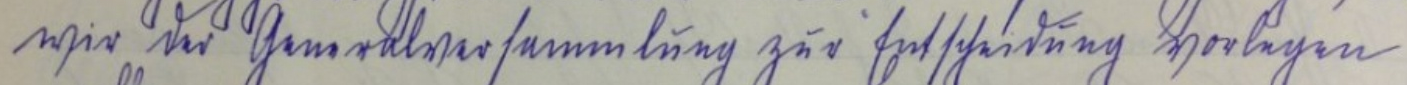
wir der Generalversammlung zur Entscheidung vorlegen
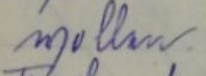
wollen.
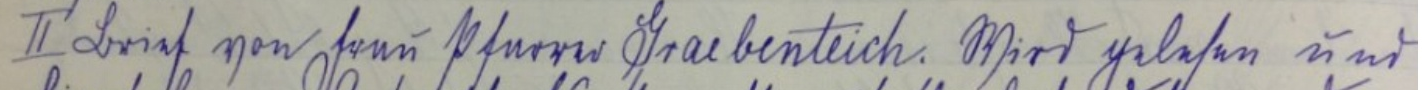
II Brief von Frau Pfarrer Graebenteich. Wird gelesen
